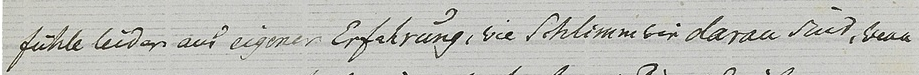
fühle leider aus eigener Erfahrung, wie schlimm wir daran sind, wenn
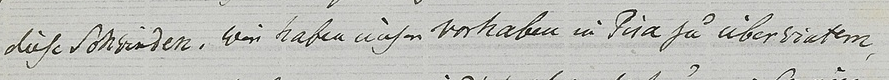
diese schwinden. Wir haben unser Vorhaben in Pisa zu überwintern,
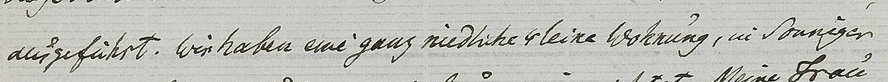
ausgeführt. Wir haben eine ganz niedliche kleine Wohnung, in sonniger
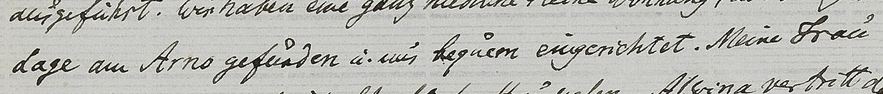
Lage am Arno gefunden u. uns bequem eingerichtet. Meine Frau
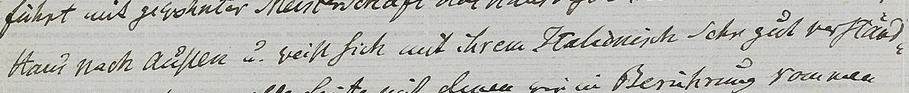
Haus nach Aussen u. weiss sich mit ihrem Italienisch sehr gut verständ-
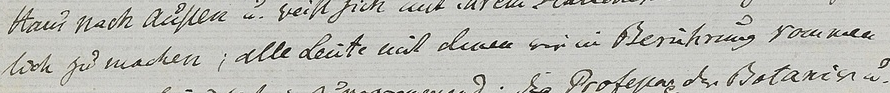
lich zu machen; alle Leute mit denen wir in Berührung kommen
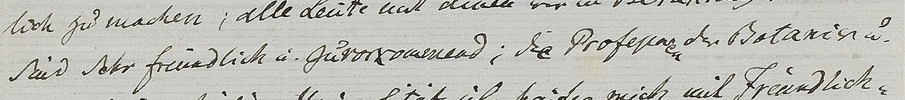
sind sehr freundlich u. zuvorkommend; die Professoren der Botanik u.
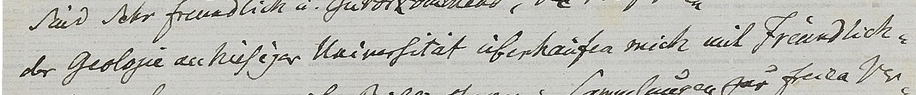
der Geologie an hiesiger Universität überhäufen mich mit Freundlich-
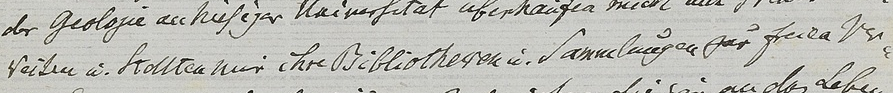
keiten u. stellten mir ihre Bibliotheken u. Sammlungen zur freien Ver-
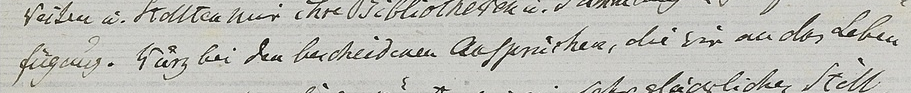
fügung. Kurz bei den bescheidenen Ansprüchen, die wir an das Leben
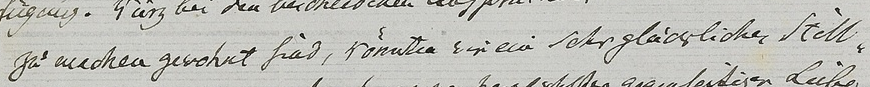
zu machen gewohnt sind, könnten wir ein sehr glückliches Still-
